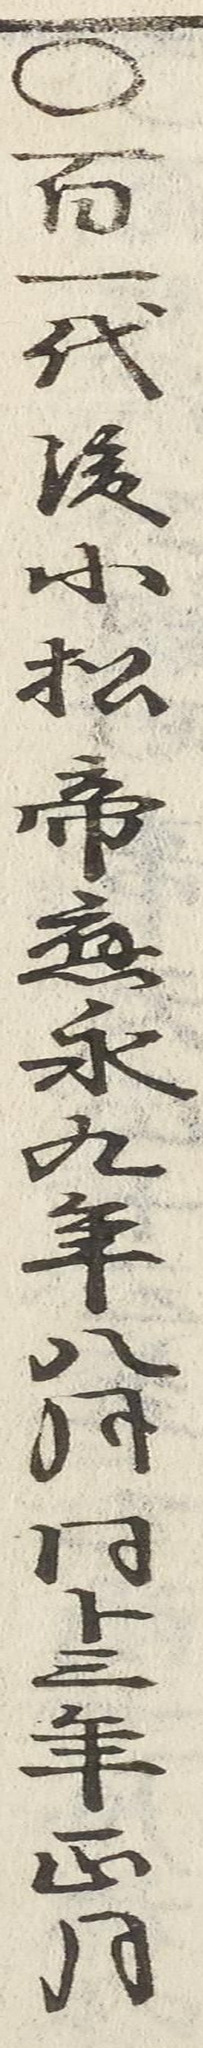○百一代後小松帝応永九年八月同十三年正月
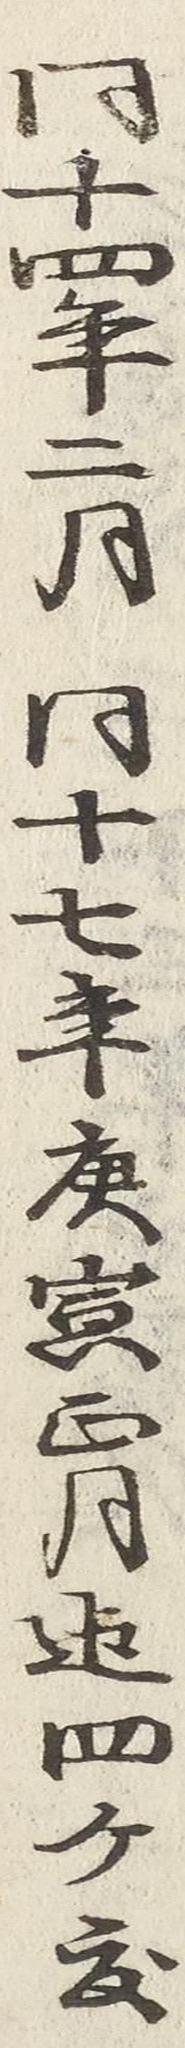同十四年二月同十七年庚寅正月迄四ヶ度
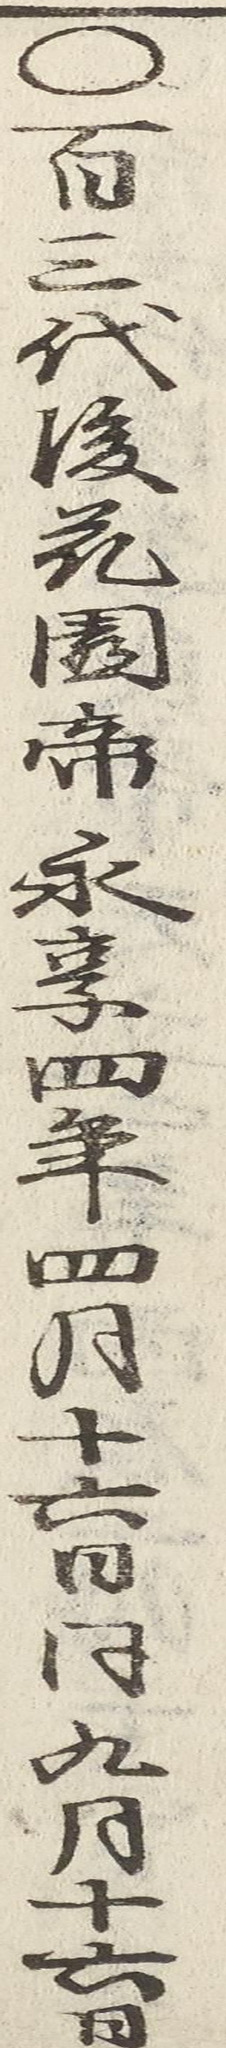○百三代後花園帝永享四年四月十六日同九月十六日
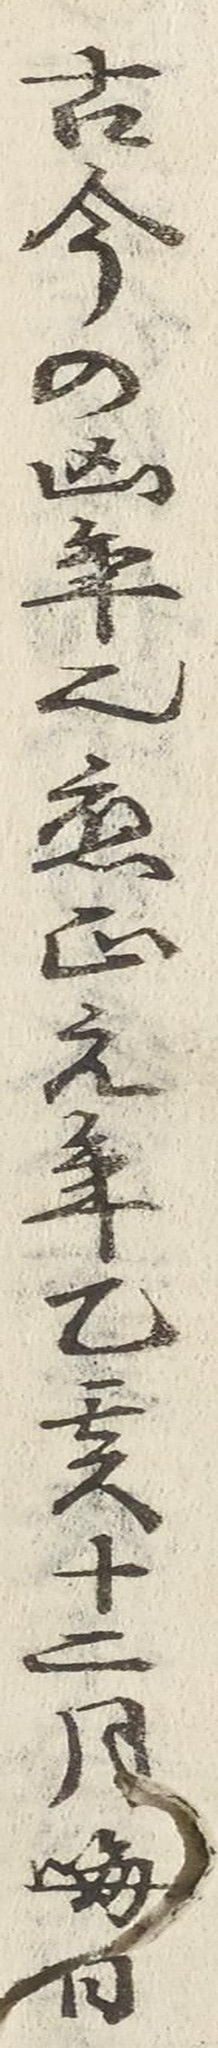古今の凶年也応正元年乙亥十二月晦日
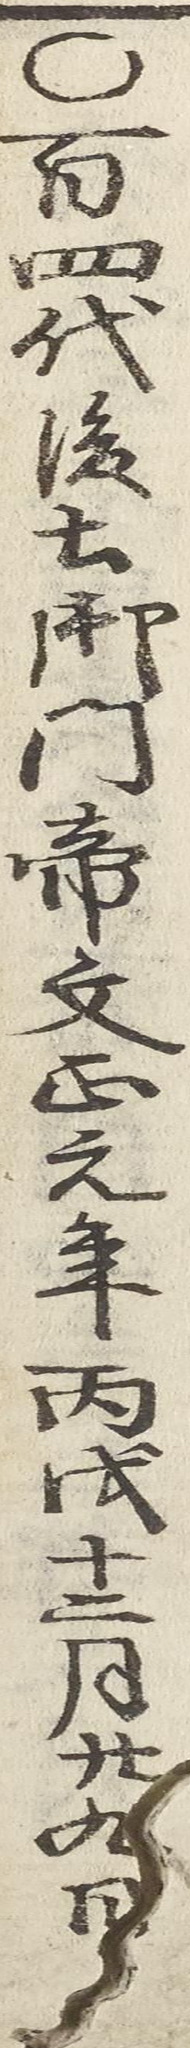○百四代後土御門帝文正元年丙戌十二月廿九日

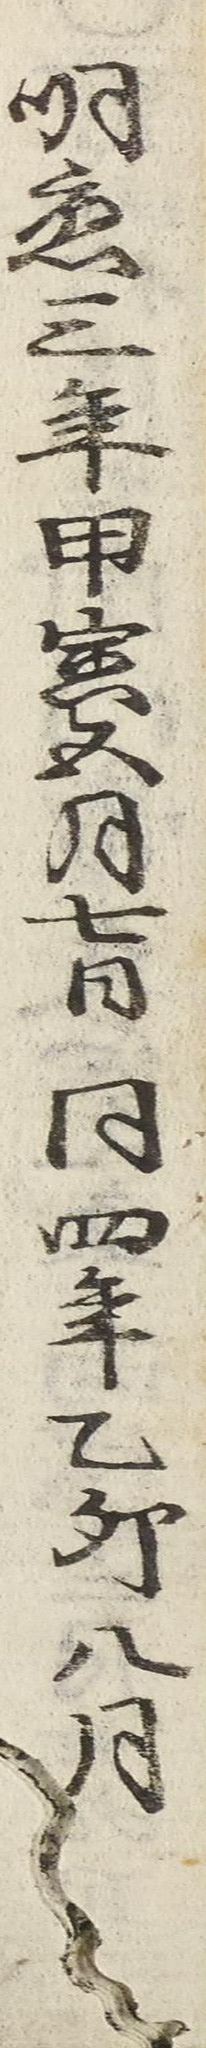明応三年甲寅五月七日同四年乙卯八月
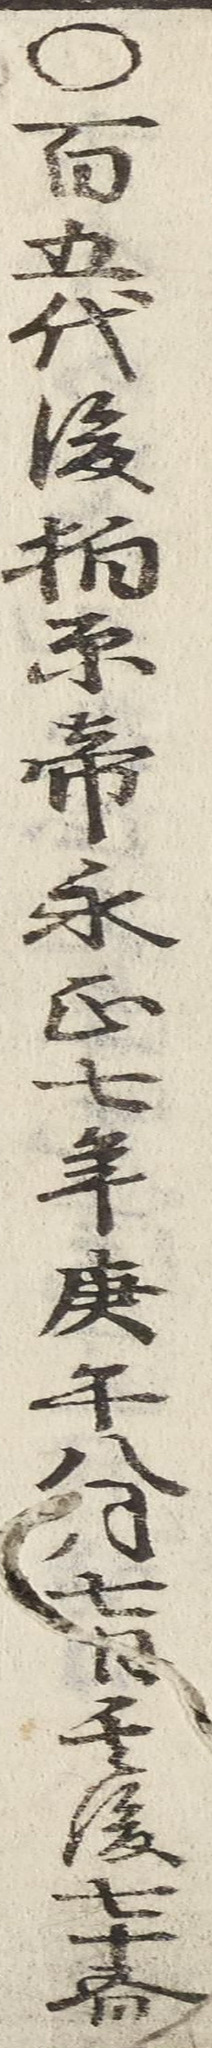○百五代後柏原帝永正七年庚午八月七日其後七十五日
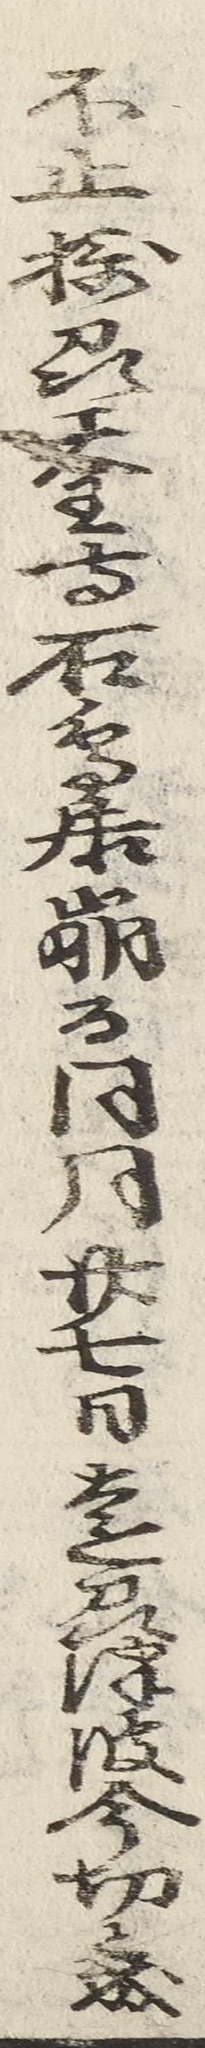不止摂州天王寺石鳥居崩る同月廿七日遠州津波今切と成
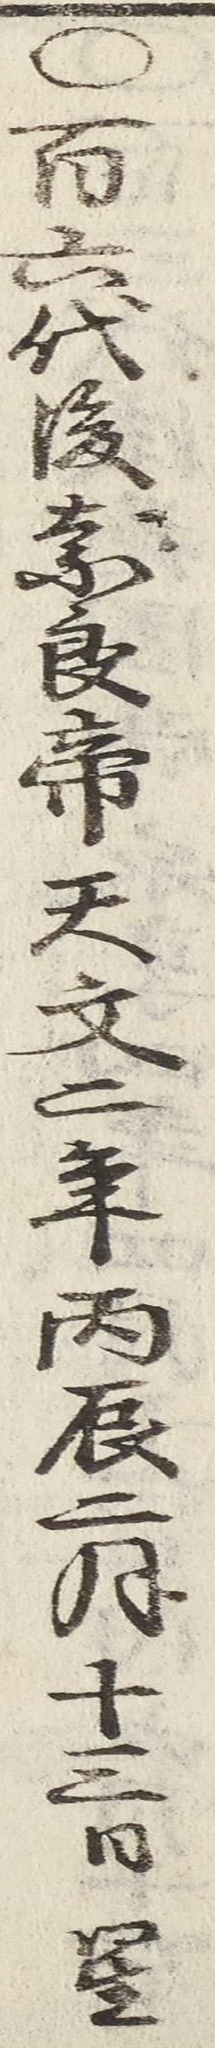○百六代後奈良帝天文二年丙辰二月十三日星
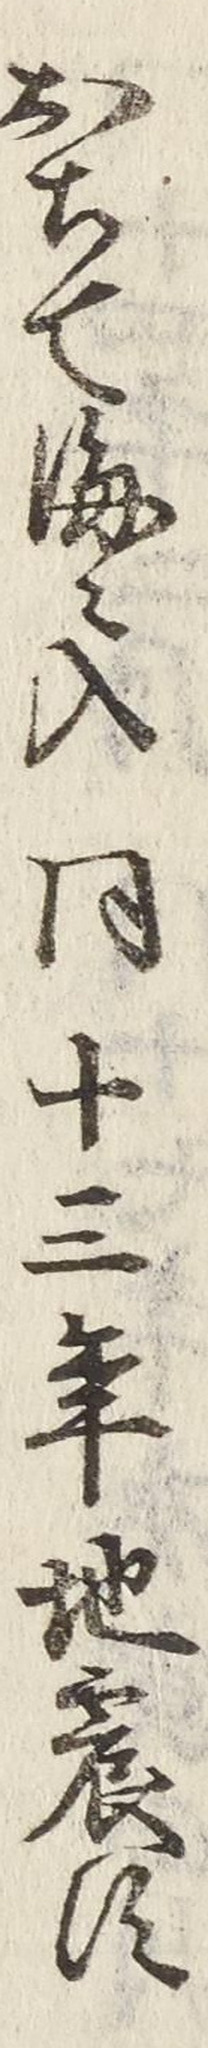おちて海に入同十三年地震す
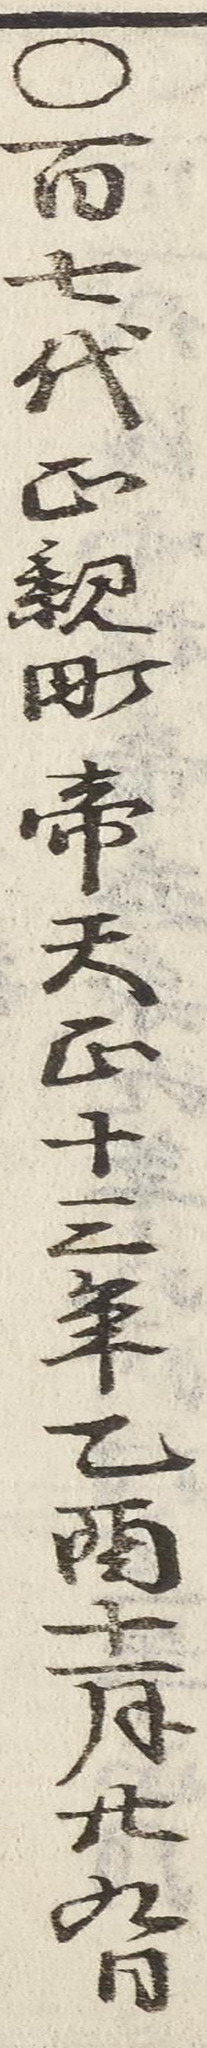○百七代正親町帝天正十三年乙酉十一月廿九日
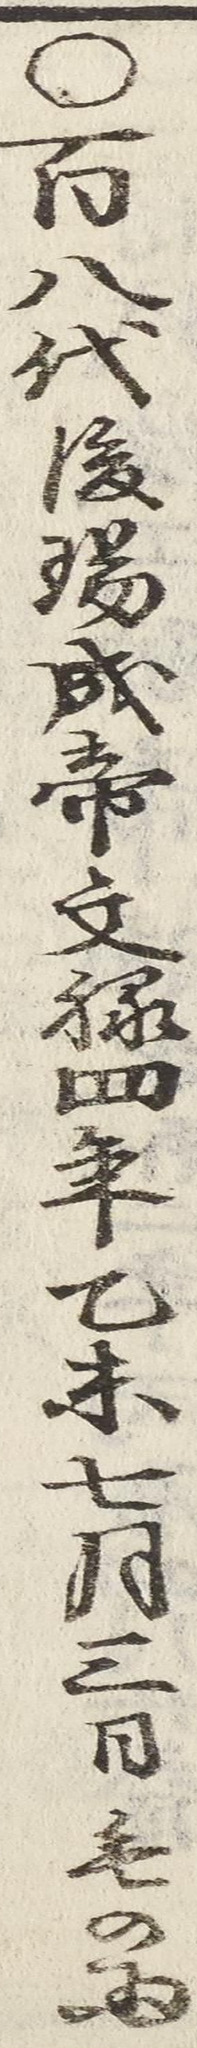○百八代後陽成帝文禄四年乙未七月三日血の雨
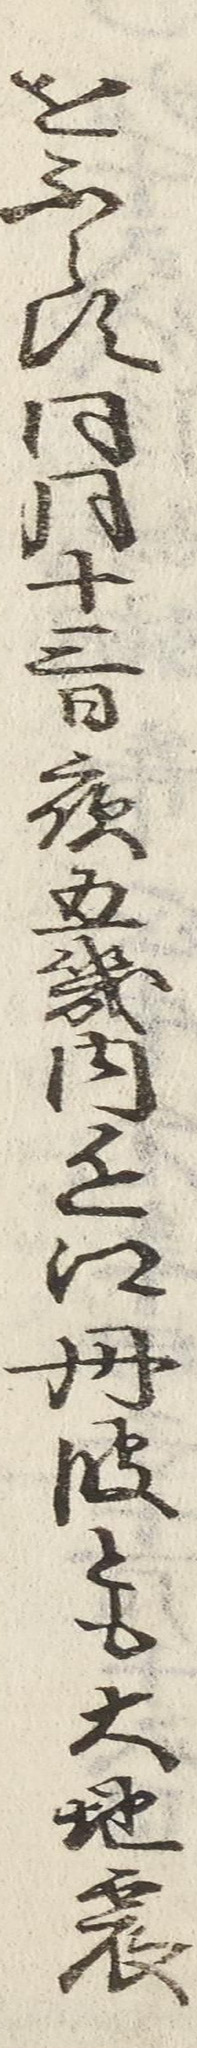をふらす同月十三日夜五畿内近江丹波とも大地震
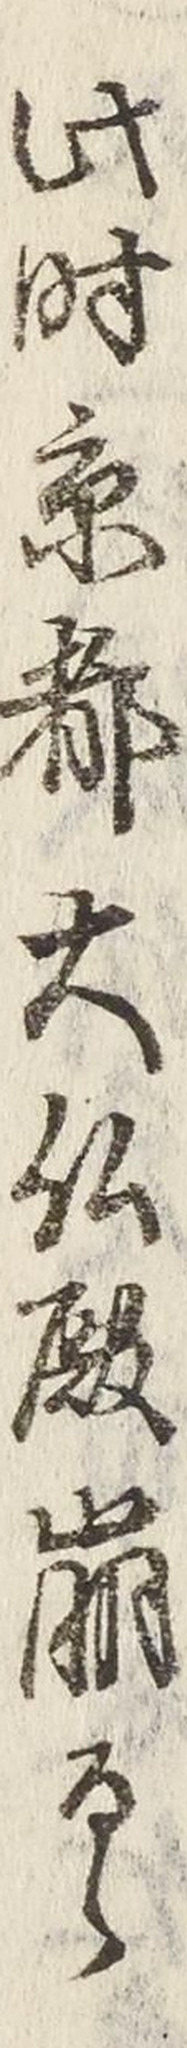此時京都大仏殿崩るゝ
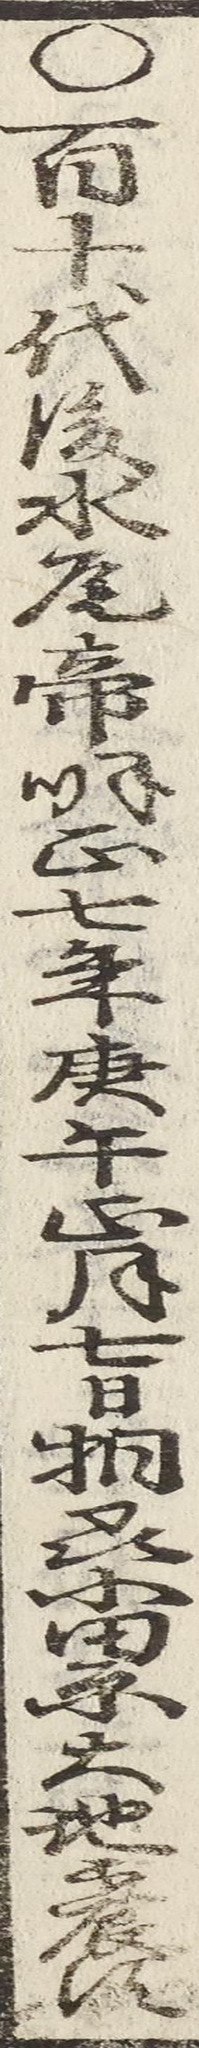○百十代後水尾帝明正七年庚午正月七日相州小田原大地震す
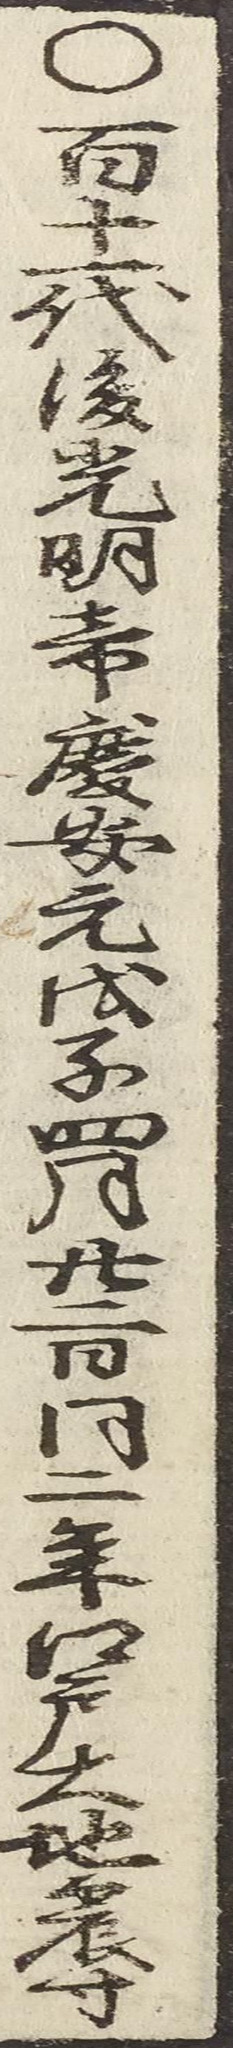○百十一代後光明帝慶安元戌子四月廿二日同二年江戸大地震す
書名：大地震世直仕艸紙
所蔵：東京大学地震研究所図書室 Earthquake Research Institute Library, The University of Tokyo, JAPAN
